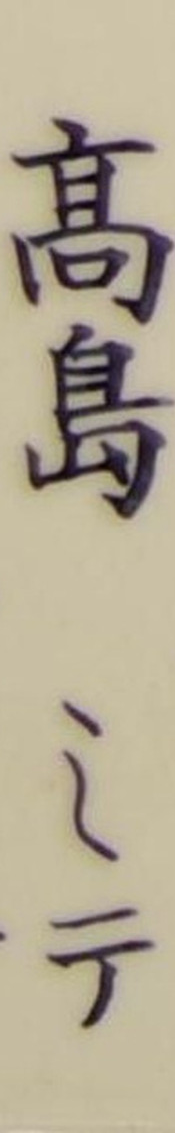高島ミテ
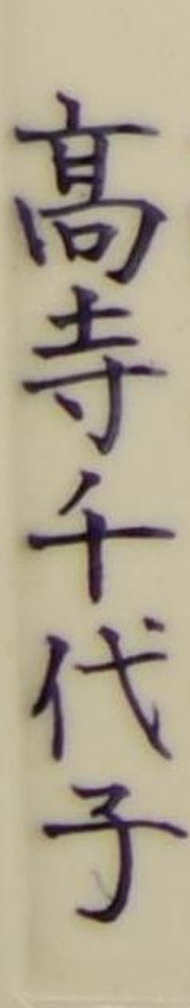高寺千代子

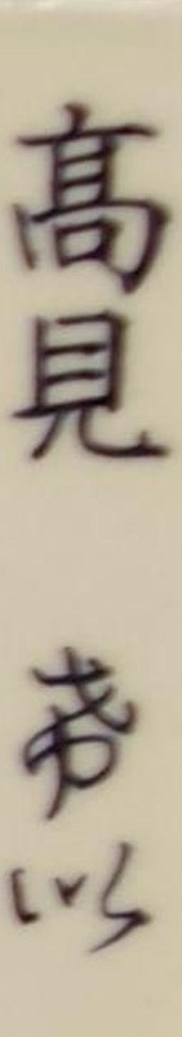高見けい
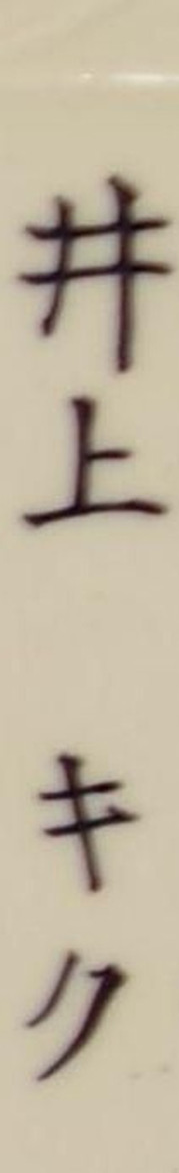井上キク
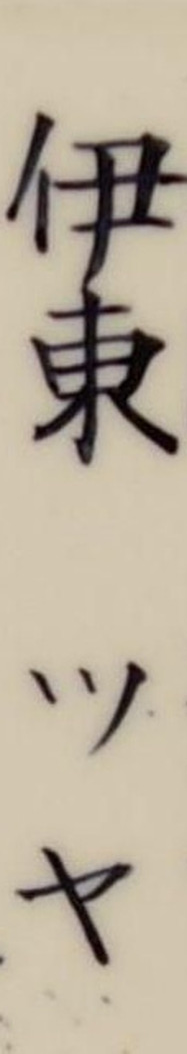伊東ツヤ
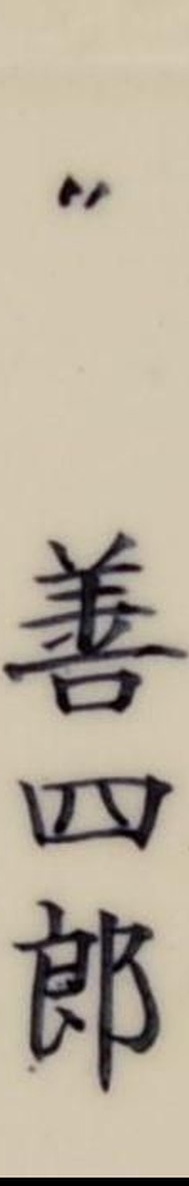善四郎
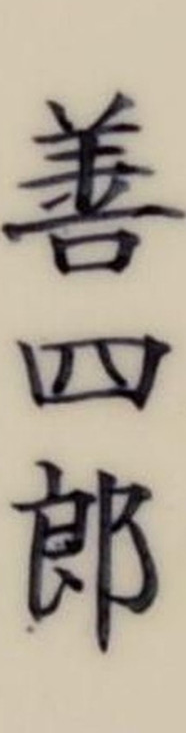善四郎
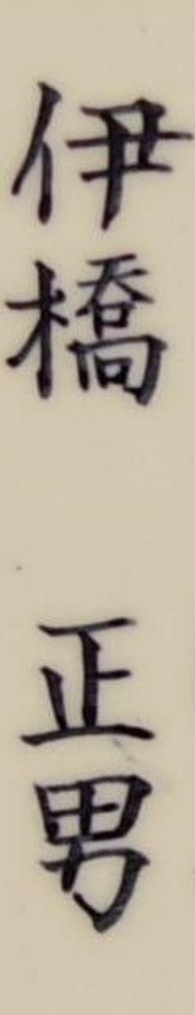伊橋正男
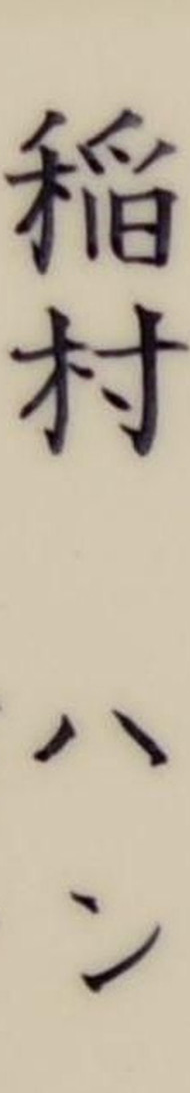稲村ハン
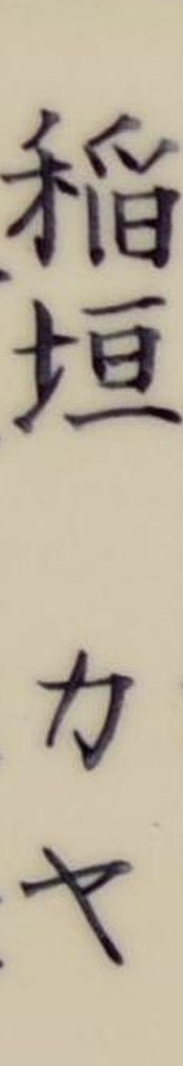稲垣カヤ
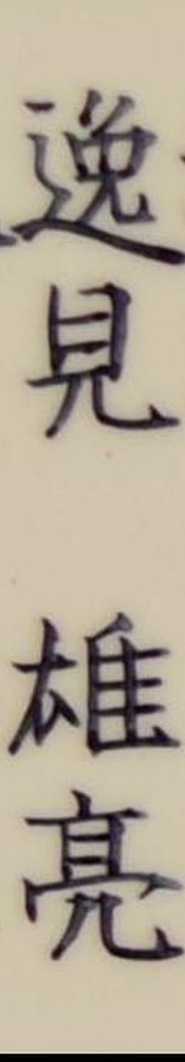逸見雄亮
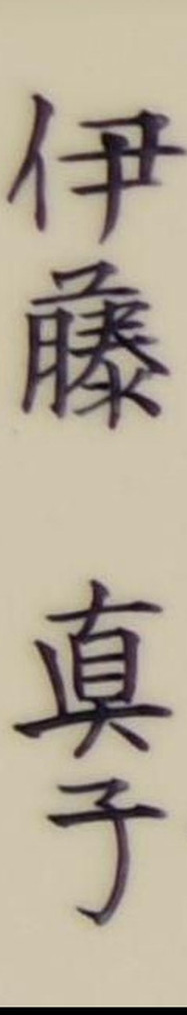伊藤真子

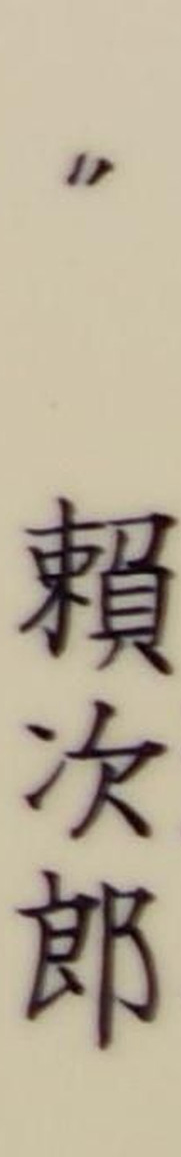瀬次郎
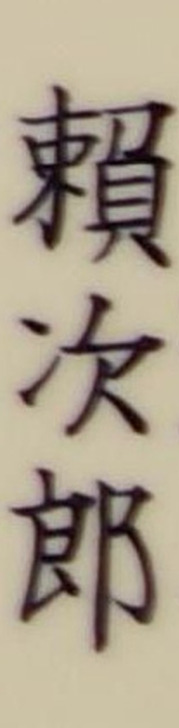瀬次郎
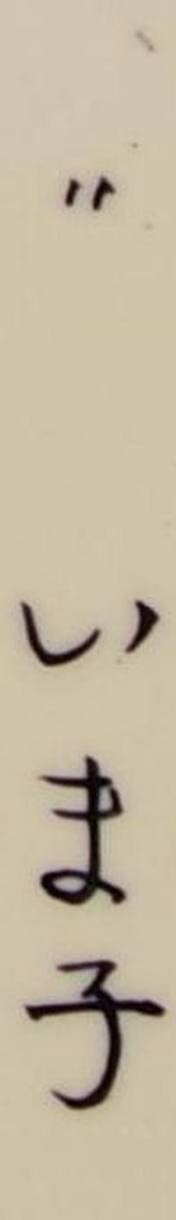いま子
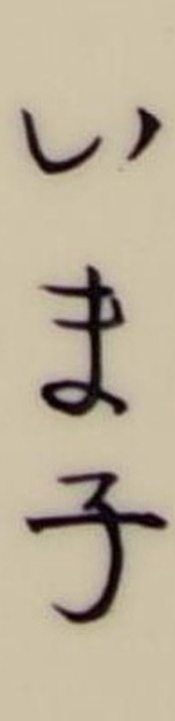いま子
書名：E~L
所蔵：高野山金剛峯寺
